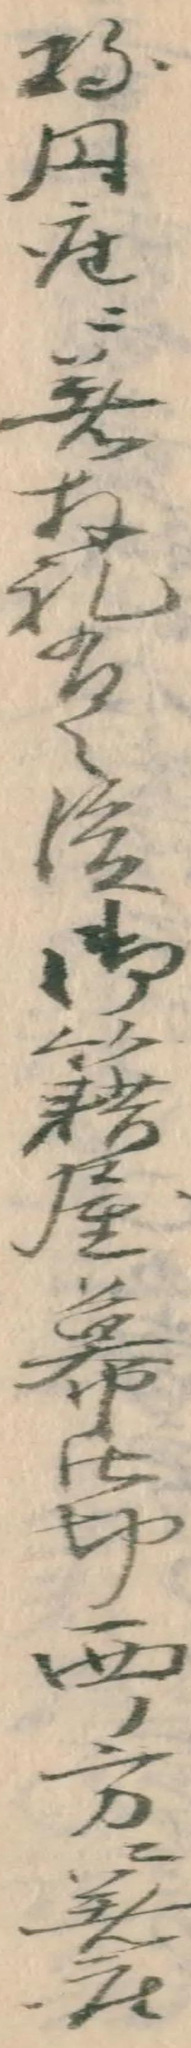縁円座に着拝礼有之後御籍屋幕仕切西ノ方ニ着座
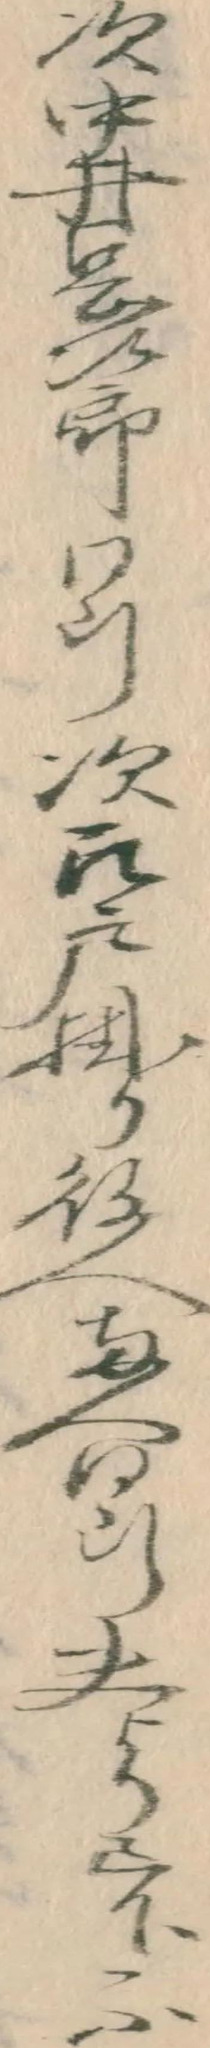次中井岡次郎同断次江戸掛り役人両人同断夫より已下不
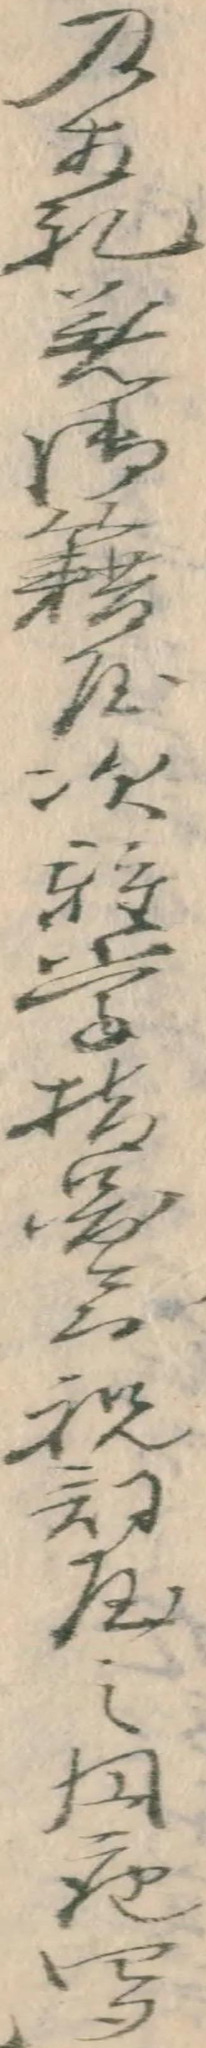及相礼着御籍屋次雑掌指図ニ而祝詞屋之円座四ツ
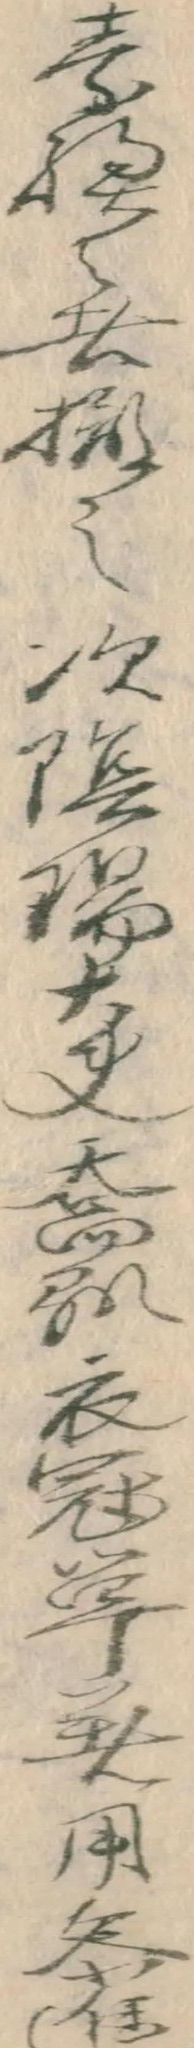素襖之者拵之次陰陽大夫喬顕衣冠単着用参進
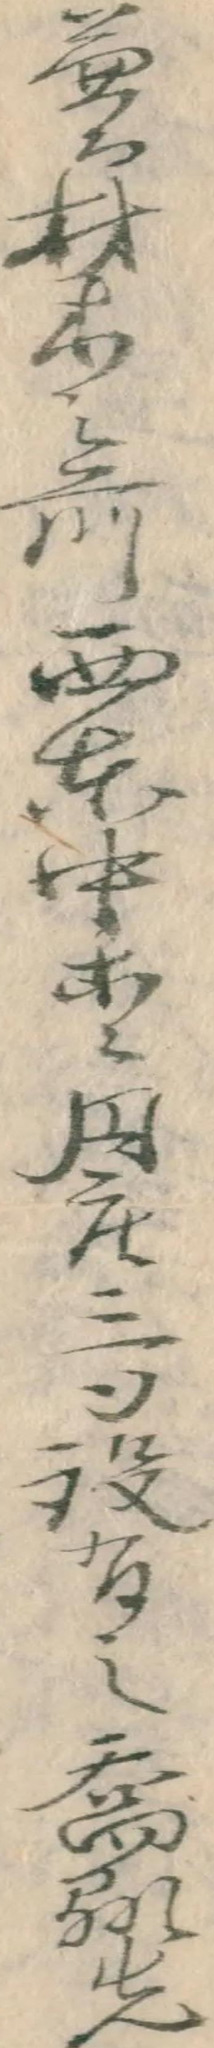兼而材木之前西東中等に円座三ツ設有之喬顕先
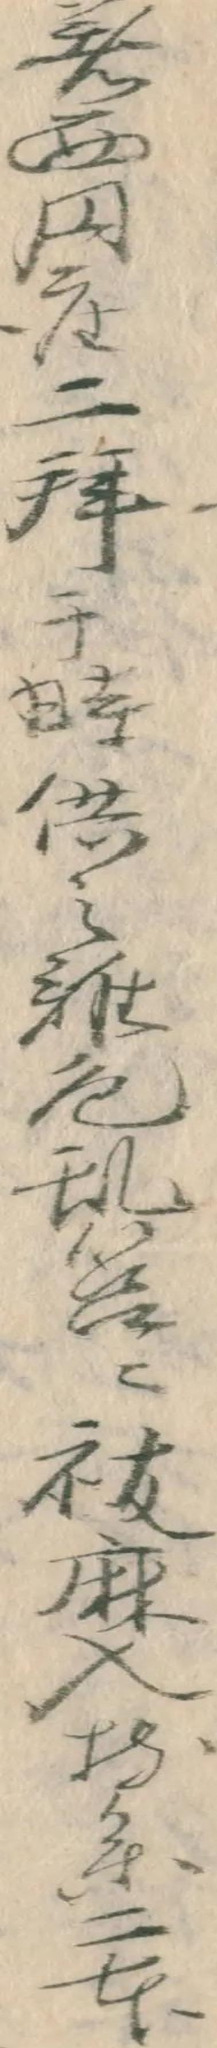着西円座二拝于時供之雑色乱筥ニ祓麻入持参二本
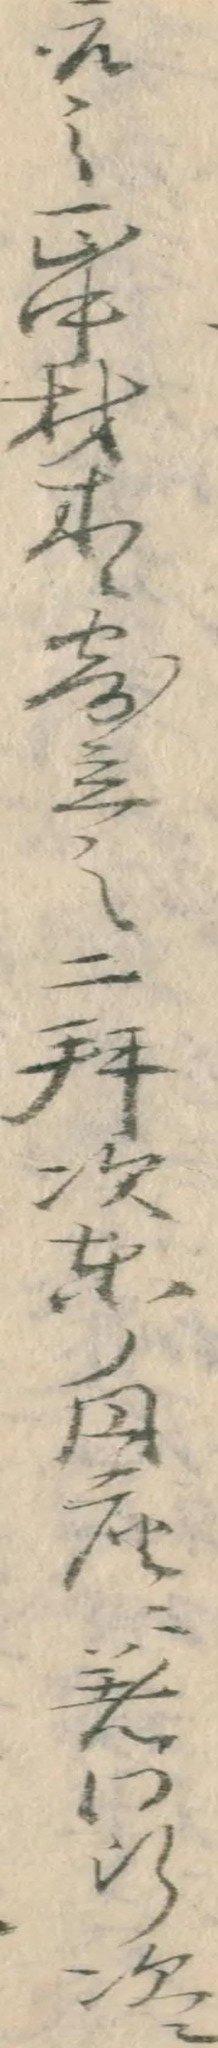取之正中材木に寄立之二拝次東ノ円座ニ着同断次ニ
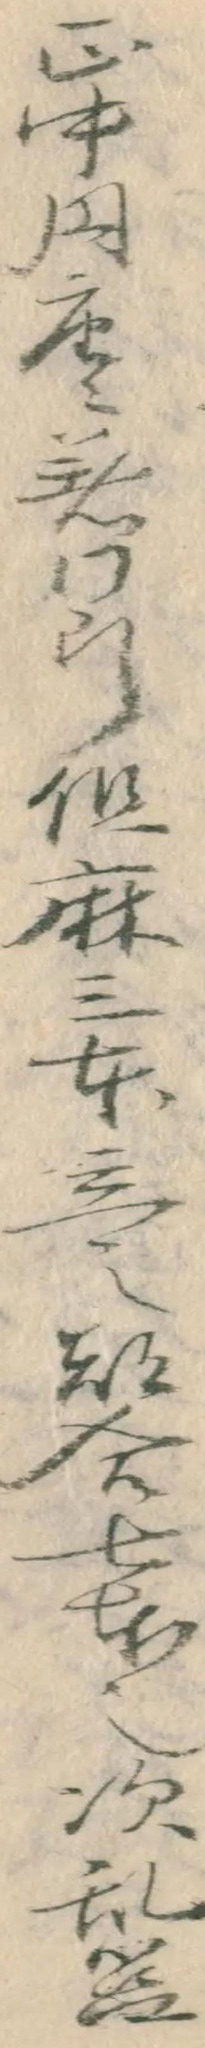正中用席ニ着同断但麻三本立之都合七本也次乱筥
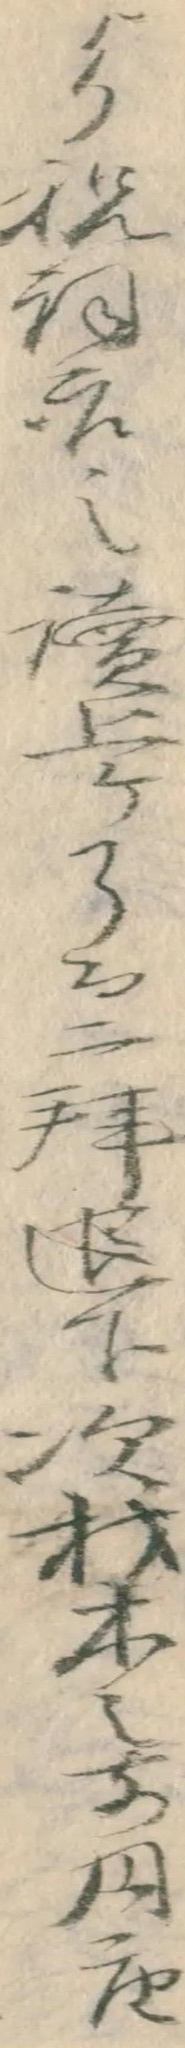より祝詞取之讀上ケ了而二拝退下次材木之前円座
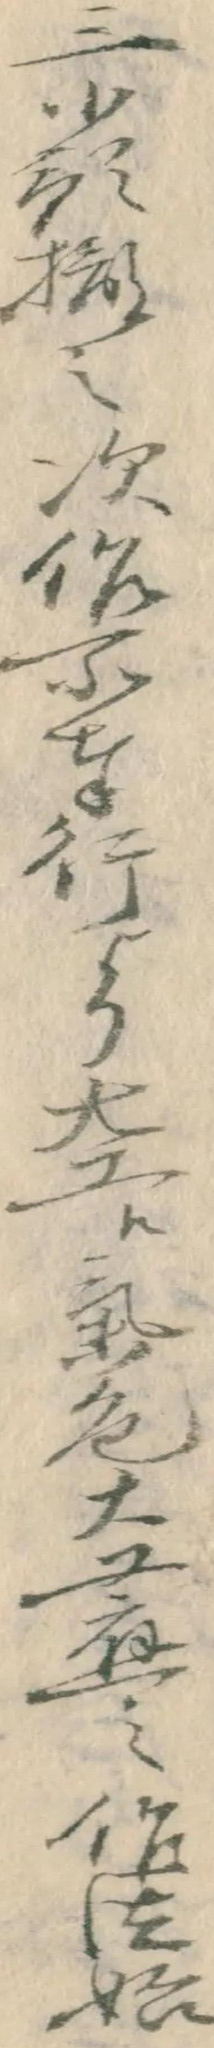三小顕撤之次作所奉行より大工え氣色大工應之作法始
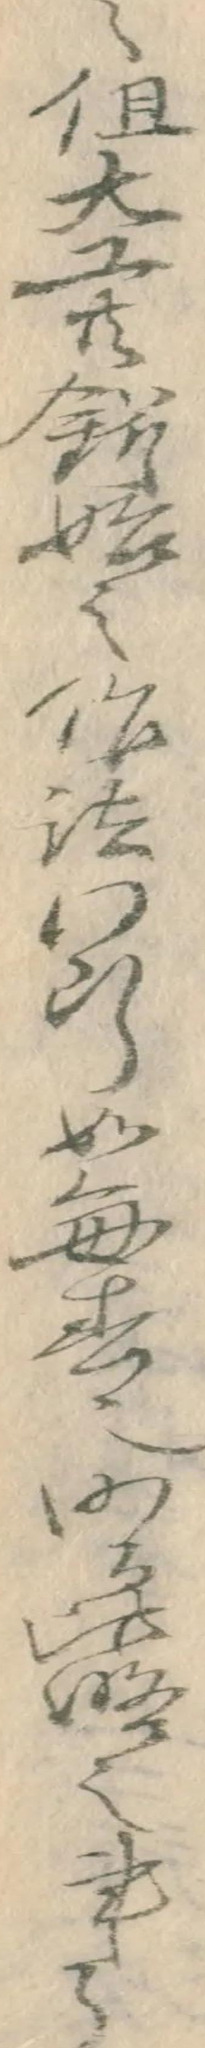之但大工共始之作法同断如毎春也仍而此略之事了

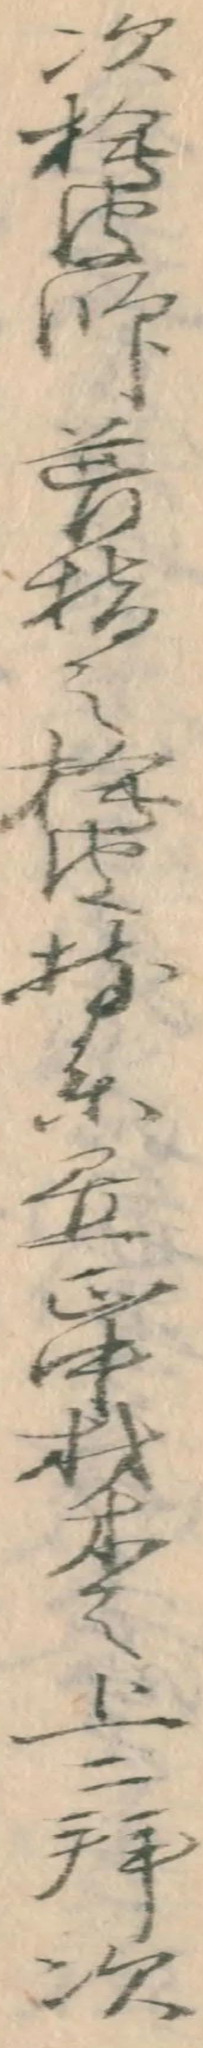次檜皮師普請之檜皮持参昼正中材木之上二拝次
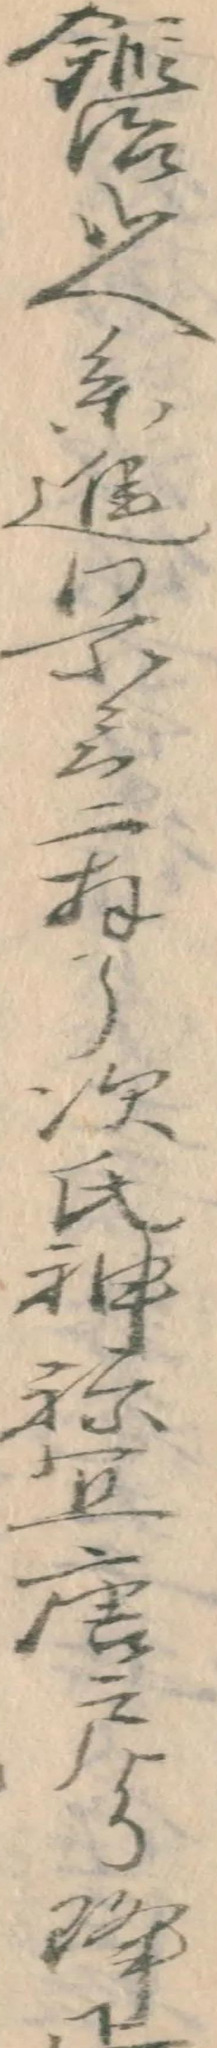鍛冶弐人参進同所ニ而二拝了次氏神称宜唐戸より降正
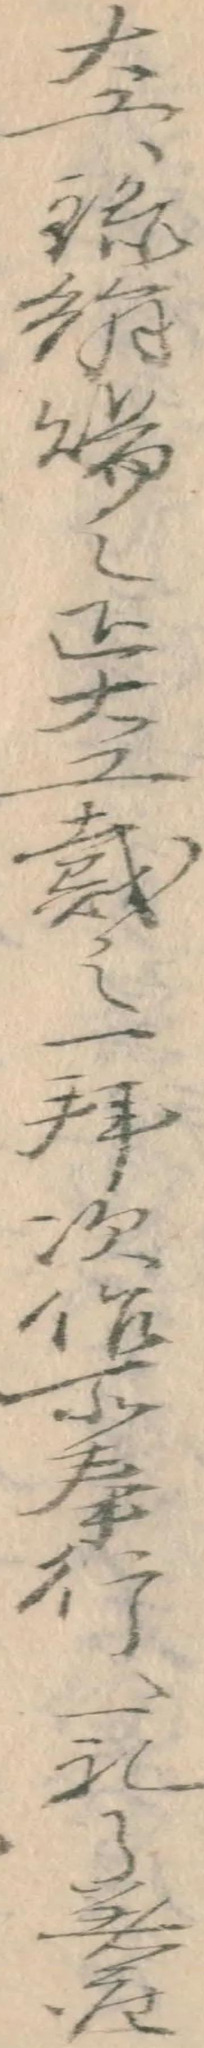大工禄絹賜之正大工戴之一拝次作所奉行へ一礼了着座
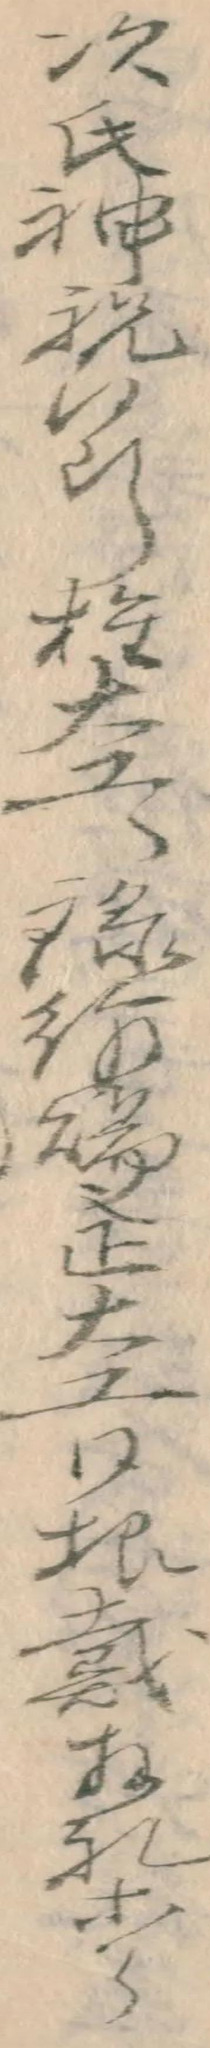次氏神祝同断権大工へ禄絹賜之正大工同様戴相礼等了
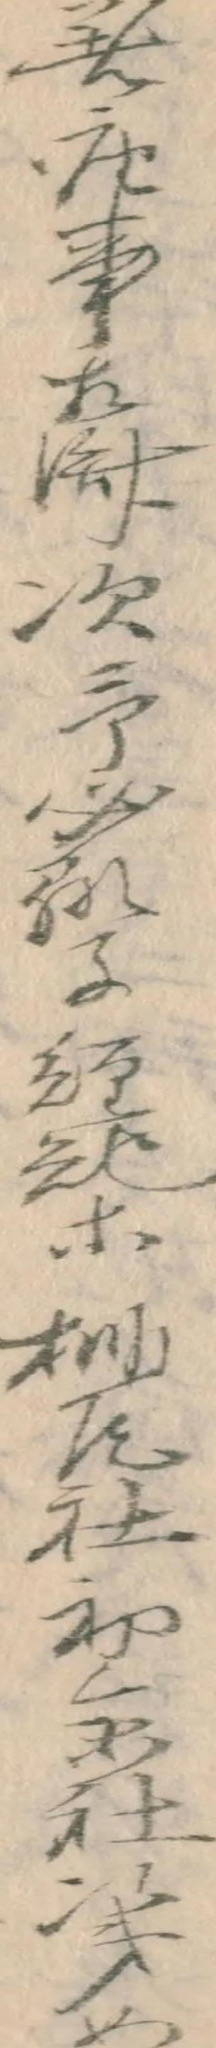着座事相済次予必顕経紀等棚尾社初参社次第如
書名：賀茂社記録. 第66冊
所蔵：国立国会図書館 National Diet Library, JAPAN
